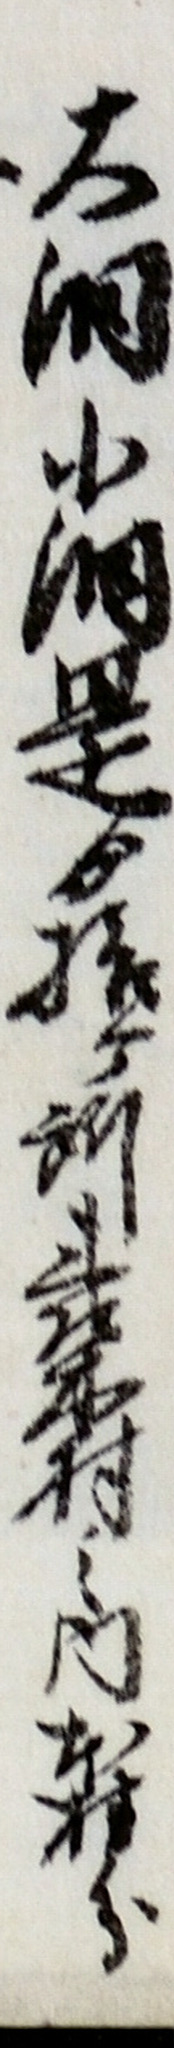大洞小洞是より拾ヶ所表木村之内本村分
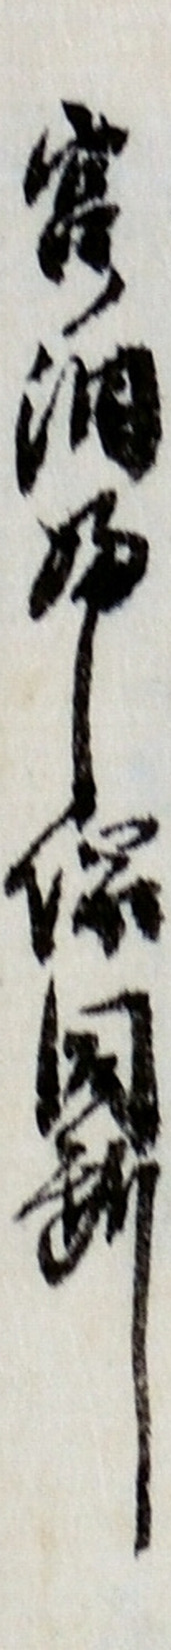宮ノ洞ふし塚同断
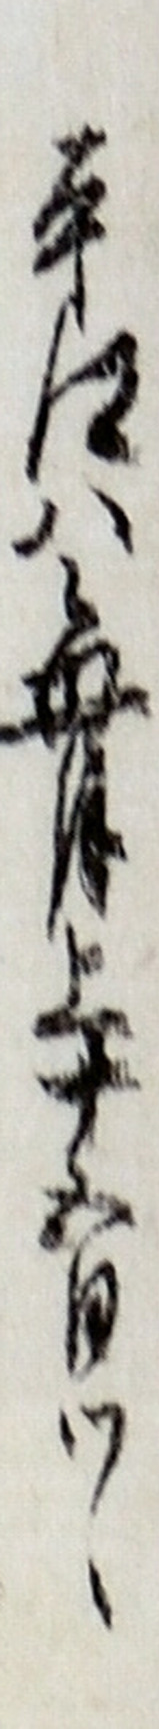本郷ハ毎月上十五日ツヽ
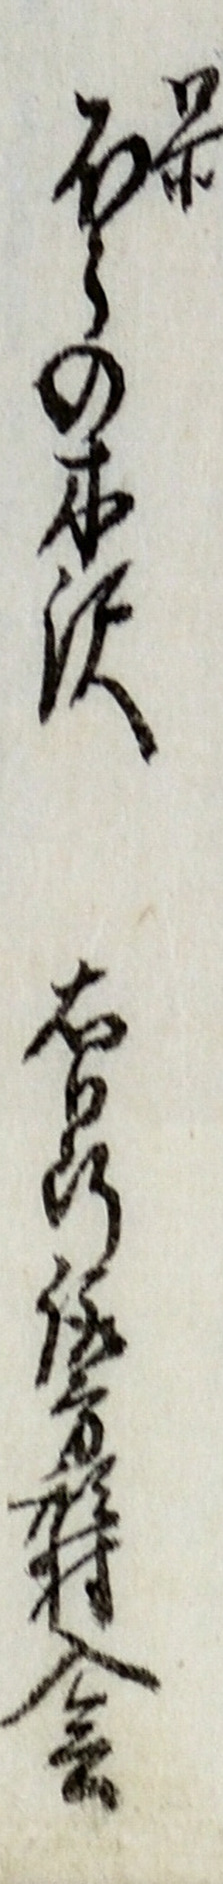ほらの木沢右同断諏訪形村入会
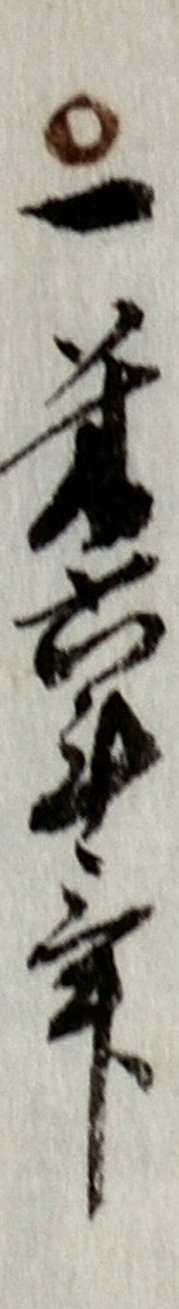○一米六斗三升
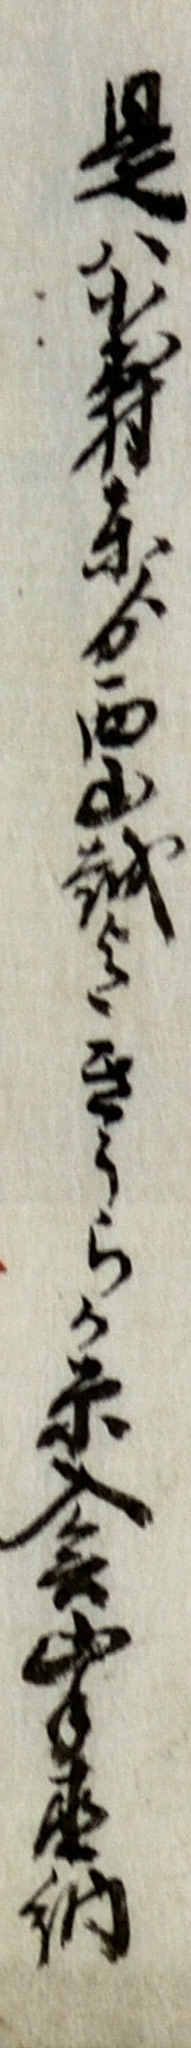是ハ小出村東より西山越迄きうらか米入会山手直納

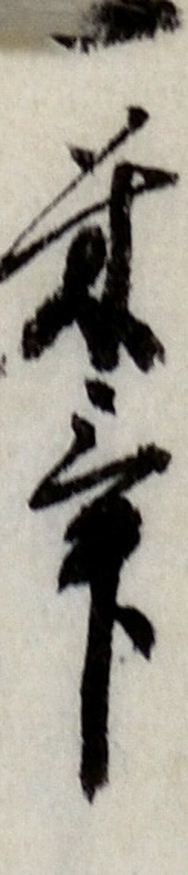一米三升
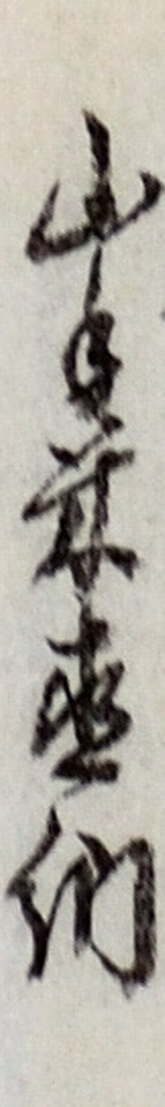山手米直納
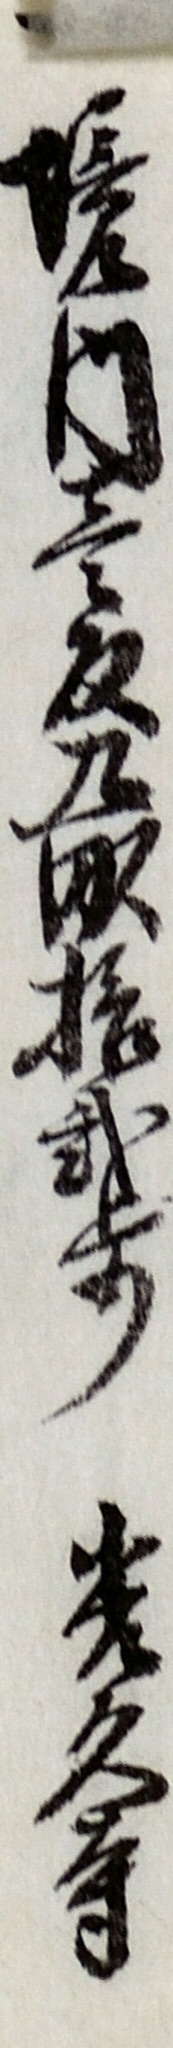一境内壱反九畝拾弐歩光久寺
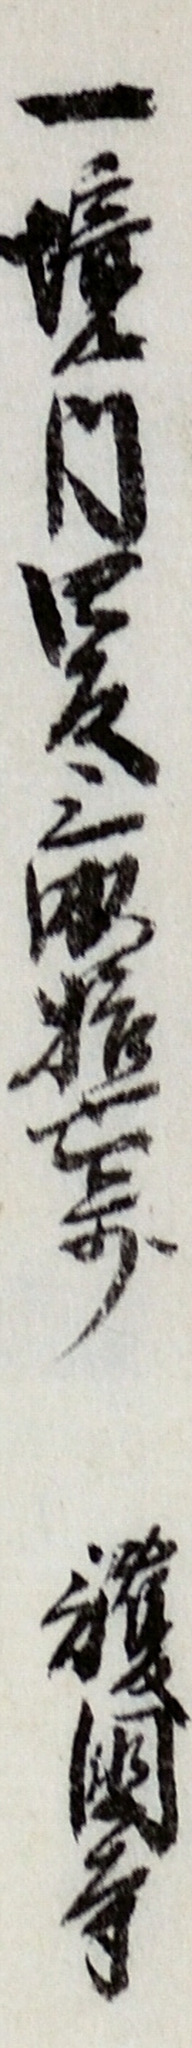一境内壱反九畝拾弐歩光久寺

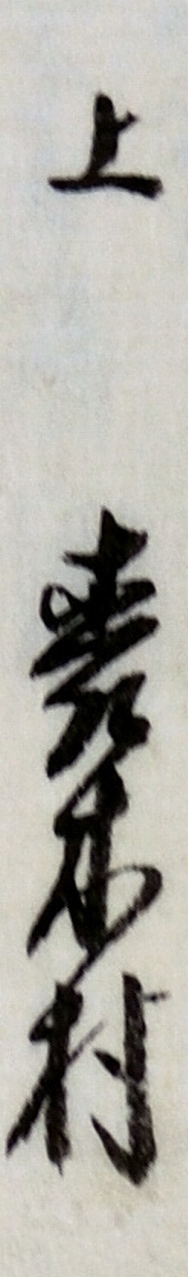上表木村
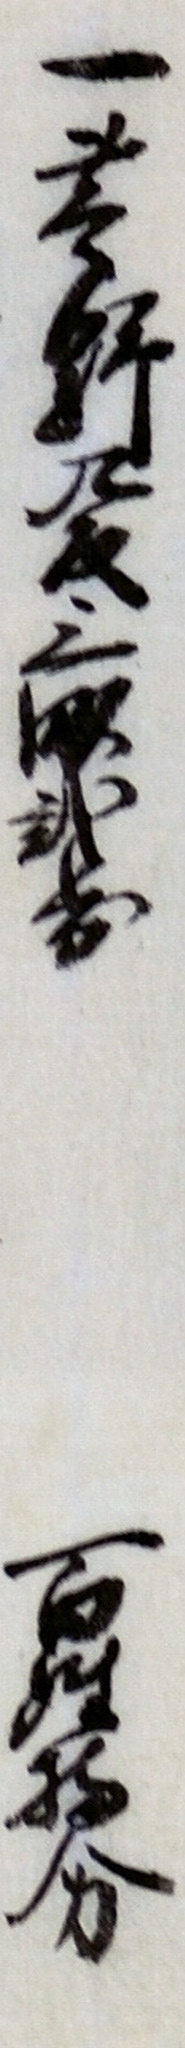一芝野九反三畝弐歩百姓持分
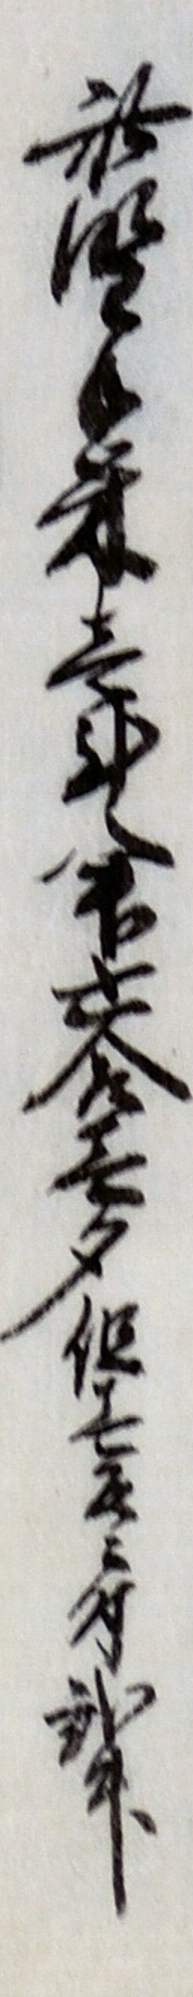此野手米壱斗八升六合七勺但壱反ニ付弐升
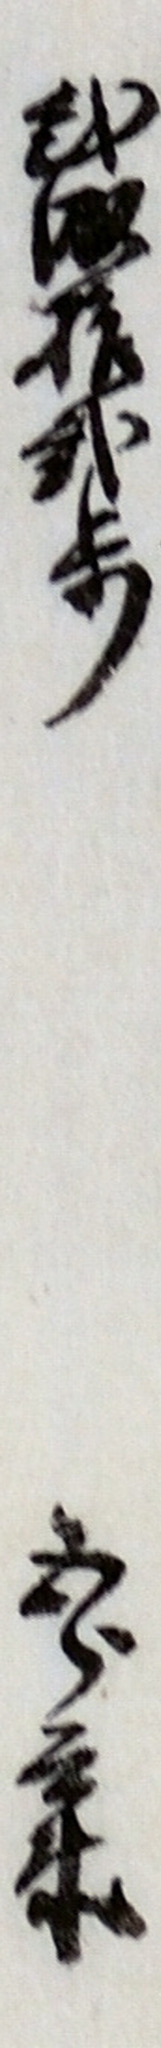弐畝拾弐歩五郎兵衛
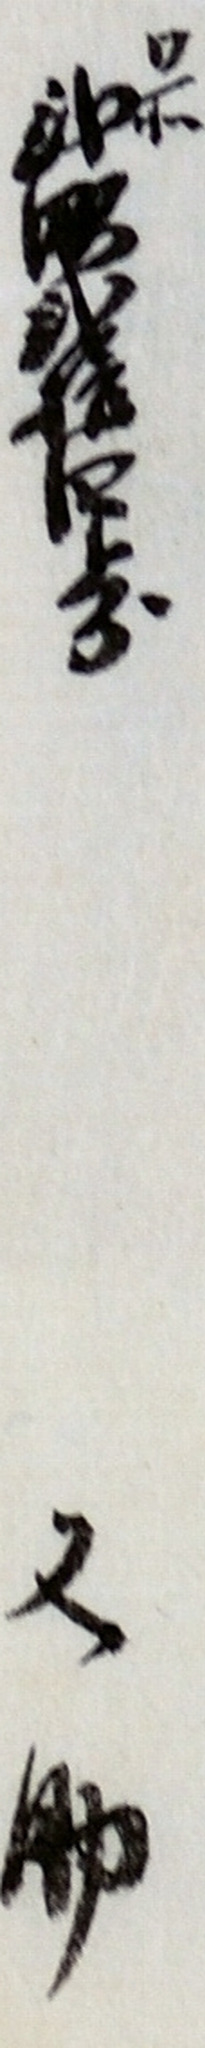弐畝弐拾四歩又助
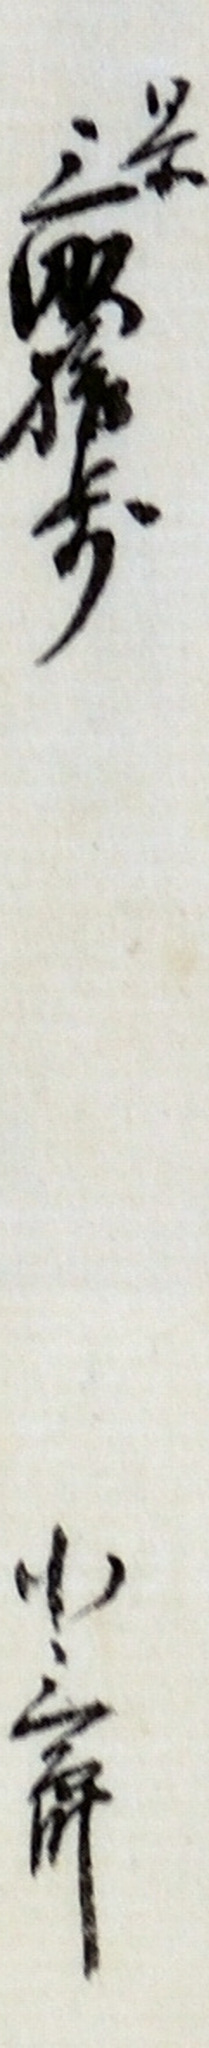三畝拾歩小三郎
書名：御領分中山林社地手控
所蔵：伊那市立高遠町図書館・合同会社AMANE
